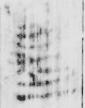是
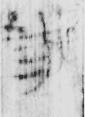歲（歲）
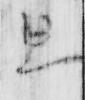也
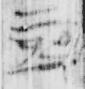亟（期）
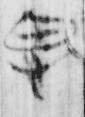思
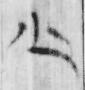少
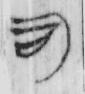司
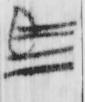馬
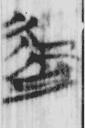○（屈）
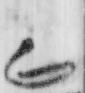㠯（以）
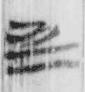足
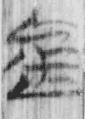金
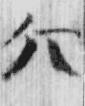六
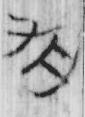匀（鈞）
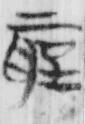聖
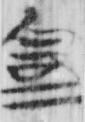命
